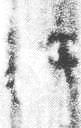○（教）
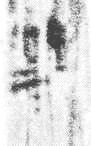箸（書）
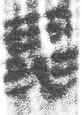晶（叄）
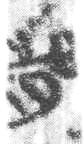歲（歲）
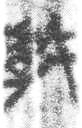○（教）
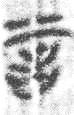言
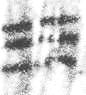三
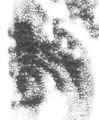歲（歲）
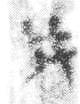○（教）
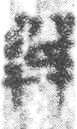○（射）
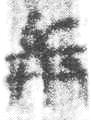與（與）
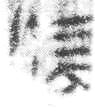○（御）
